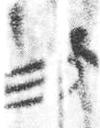易（狄）
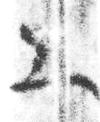之
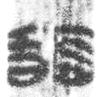○（聞）
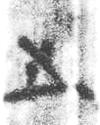之
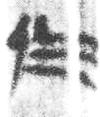於
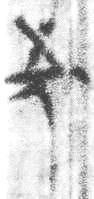先
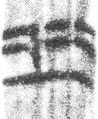王
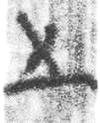之
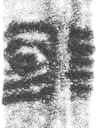灋
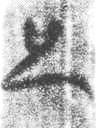也
